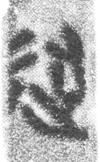述
